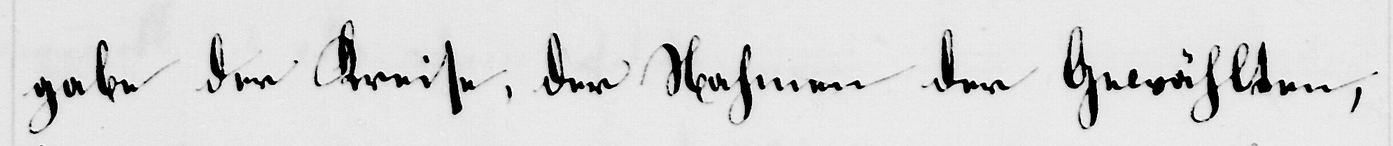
gabe der Kreise, der Nahmen der Gewählten,
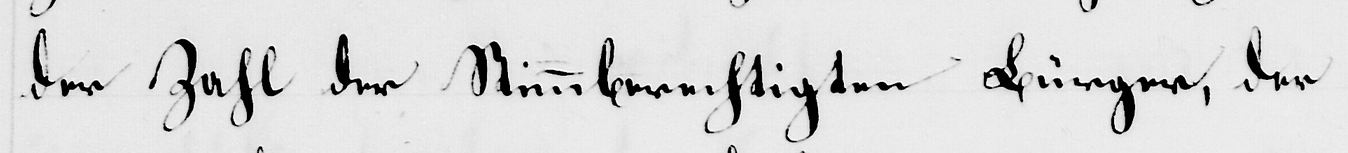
der Zahl der Stimmberechtigten Bürger, der
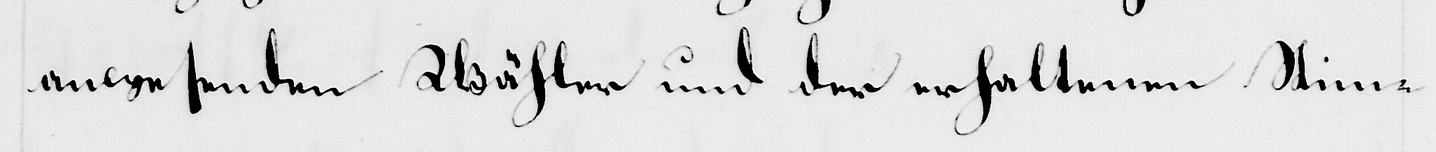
anwesenden Wähler und der erhaltenen Stim¬
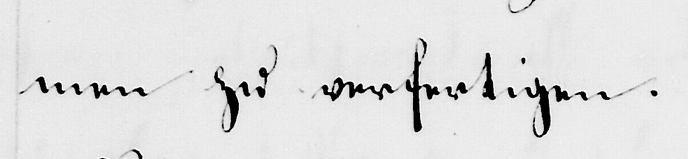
men zu verfertigen.
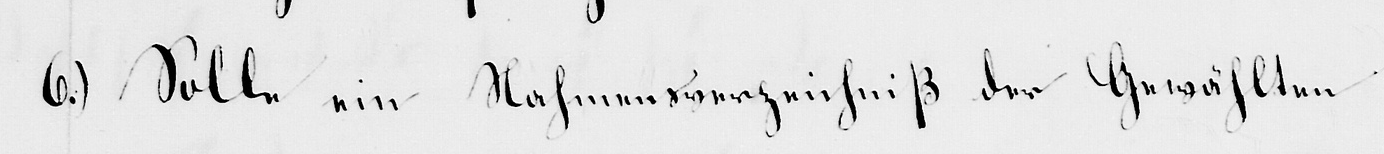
6.) Solle ein Nahmensverzeichniß der Gewählten
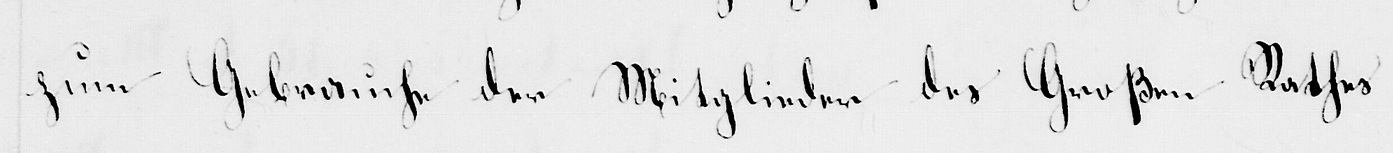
zum Gebrauche der Mitglieder des Großen Rathes
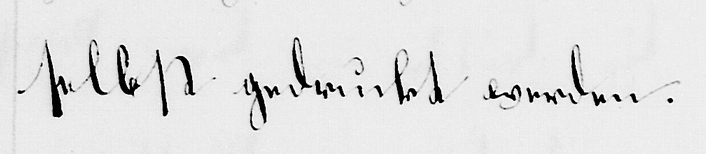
selbst gedruckt werden.
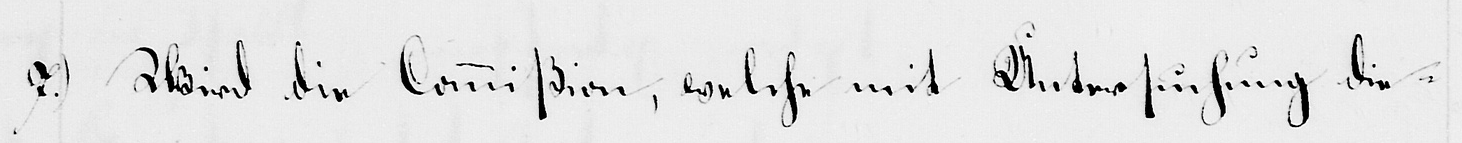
7.) Wird die Commißion, welche mit Untersuchung die¬
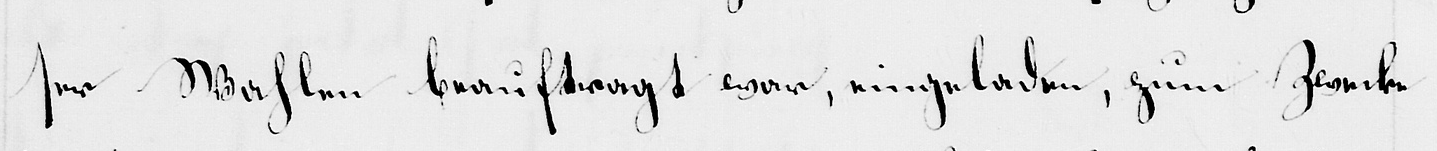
ser Wahlen beauftragt war, eingeladen, zum Zwecke
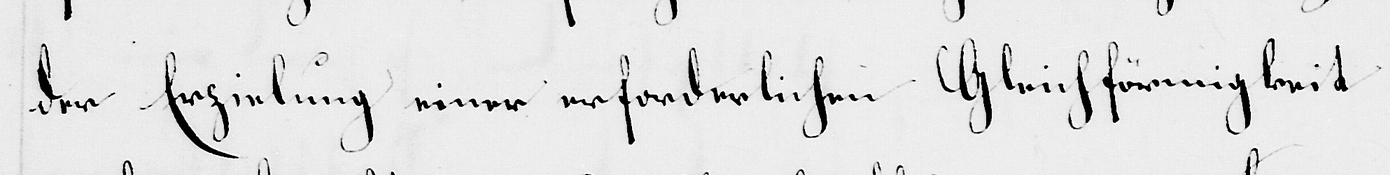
der Erzielung einer erforderlichen Gleichförmigkeit
